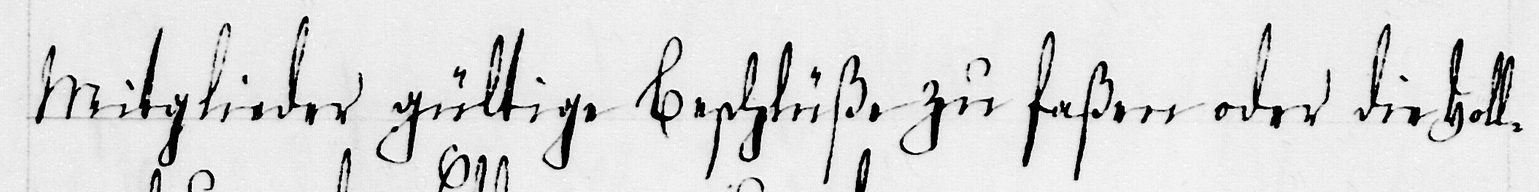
Mitglieder gültige Beschlüße zu faßen oder die Vol¬
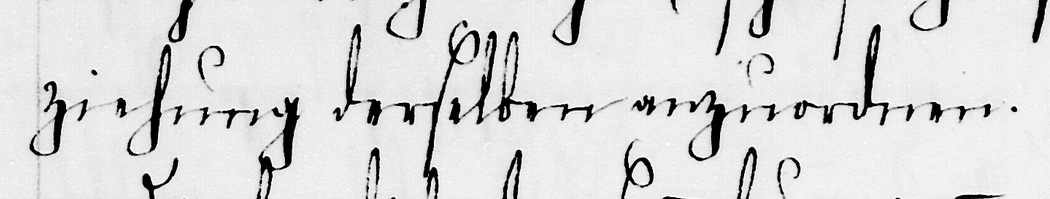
lziehung derselben anzuordnen.
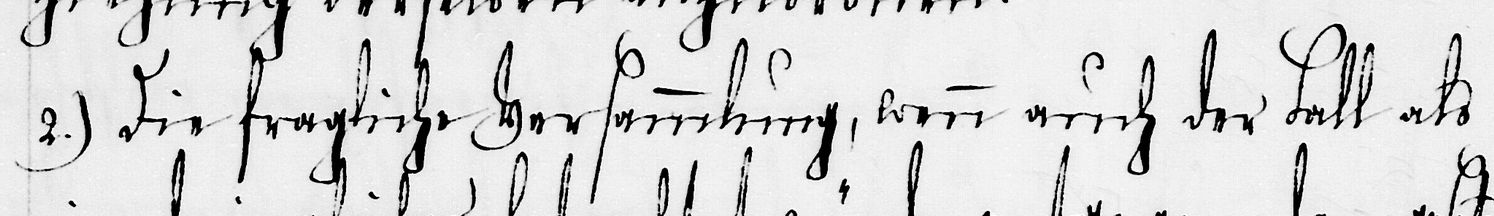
2.) Die fragliche Versammlung, wenn auch der Fall als
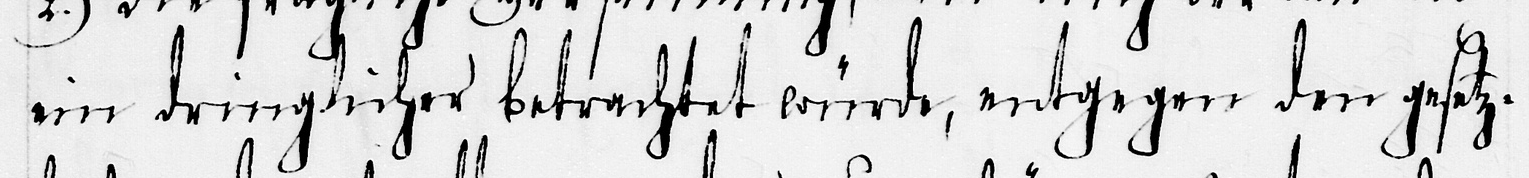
ein dringlicher betrachtet würde, entgegen den gesetz¬
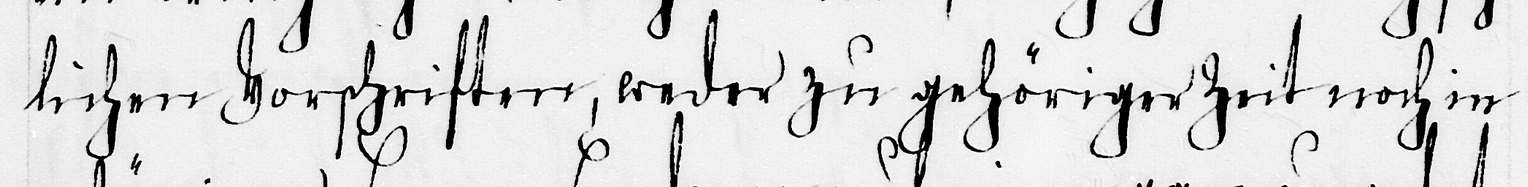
lichen Vorschriften, weder zu gehöriger Zeit noch in
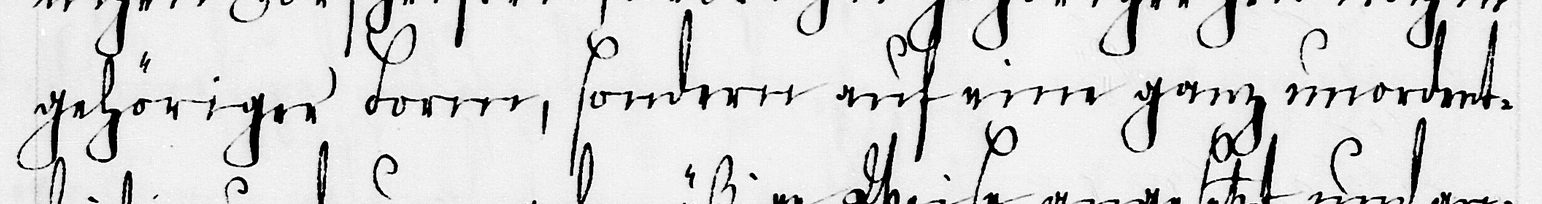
gehöriger Form, sondern auf eine ganz unordent¬
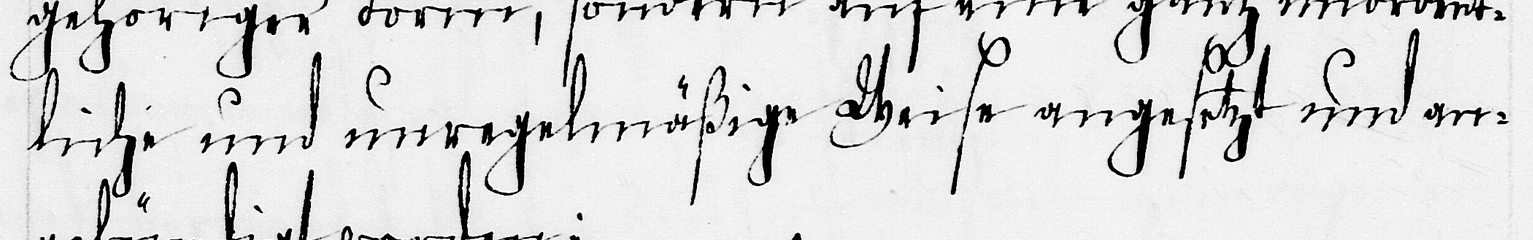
liche und unregelmäßige Weise angesetzt und an¬
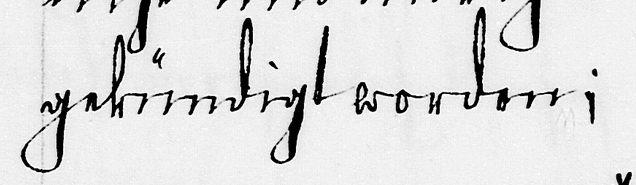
gekündigt worden;
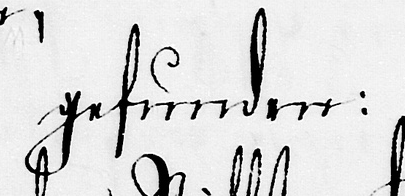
gefunden:
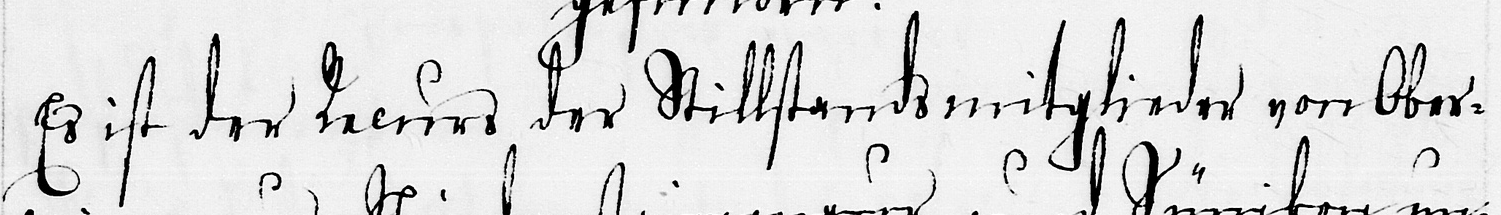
Es ist der Recurs der Stillstandsmitglieder von Ober¬
